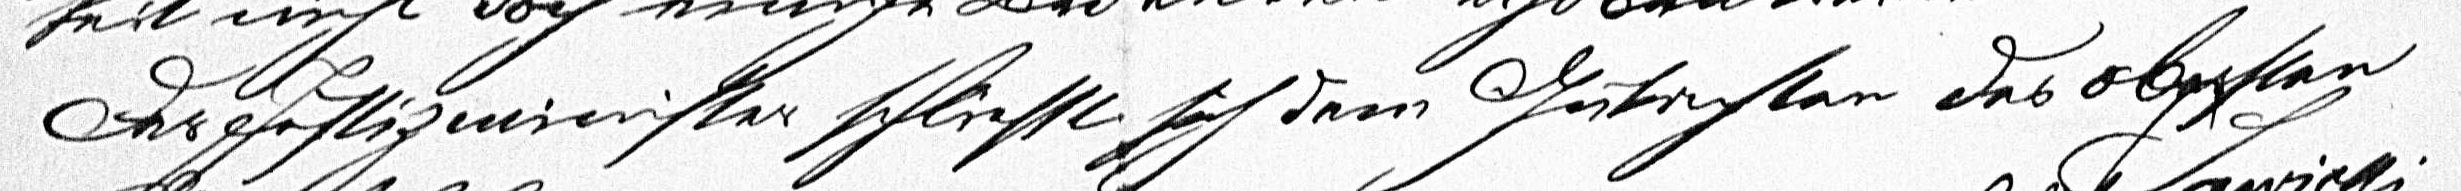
Der Justizminister schließt sich dem Gutachten des obersten
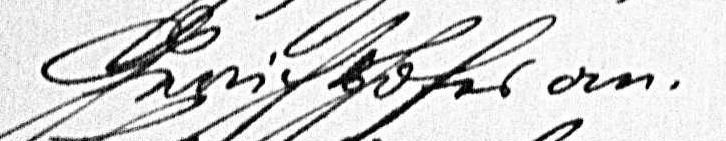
Gerichtshof an.
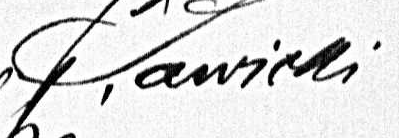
Sawicki
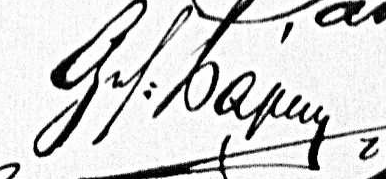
Ges. Papay
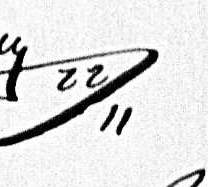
22/11
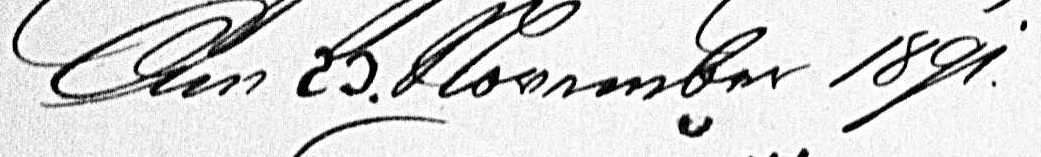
Am 23. November 1891
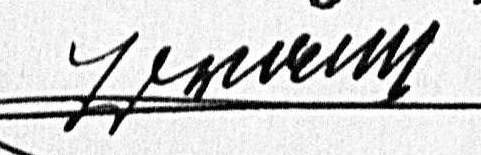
Braun
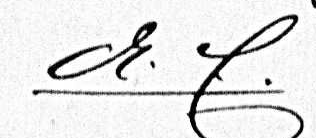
A. E.
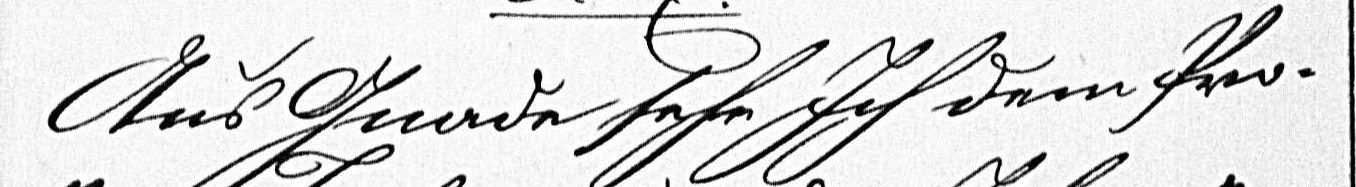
Aus Gnade sehe Ich dem Pro¬
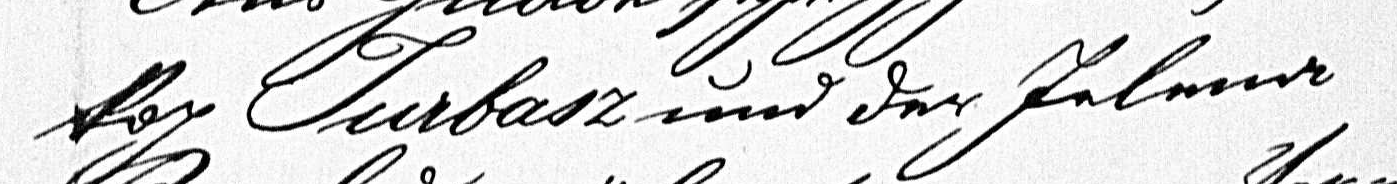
kop Iurbasz und der Jelena
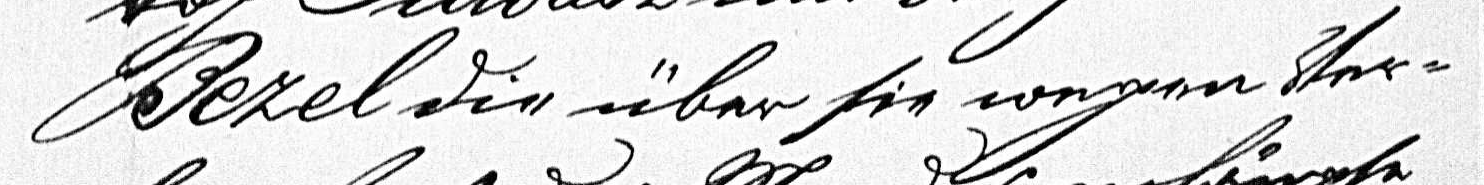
Bezel die über sie wegen Ver¬
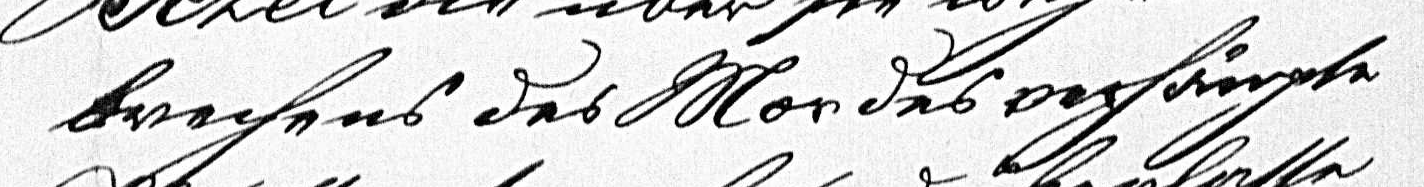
brechens des Mordes verhängte
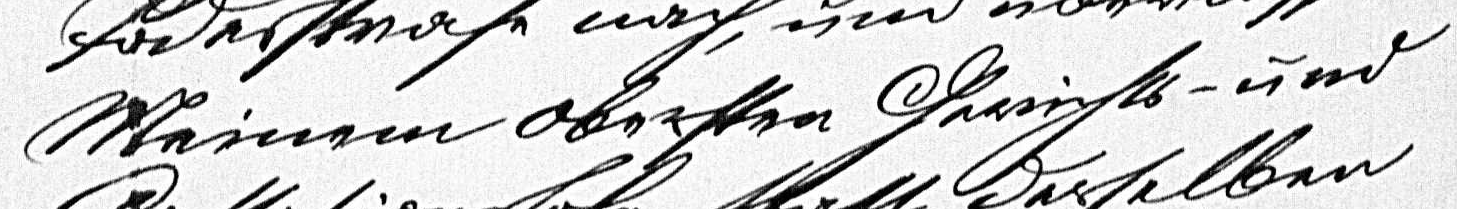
Meinem Obersten Gerichts- und
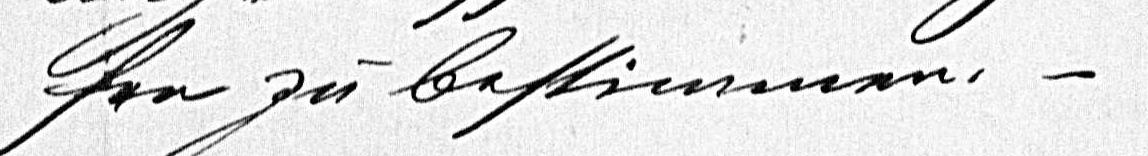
fen zu bestimmen.
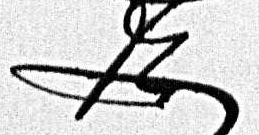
FJ
